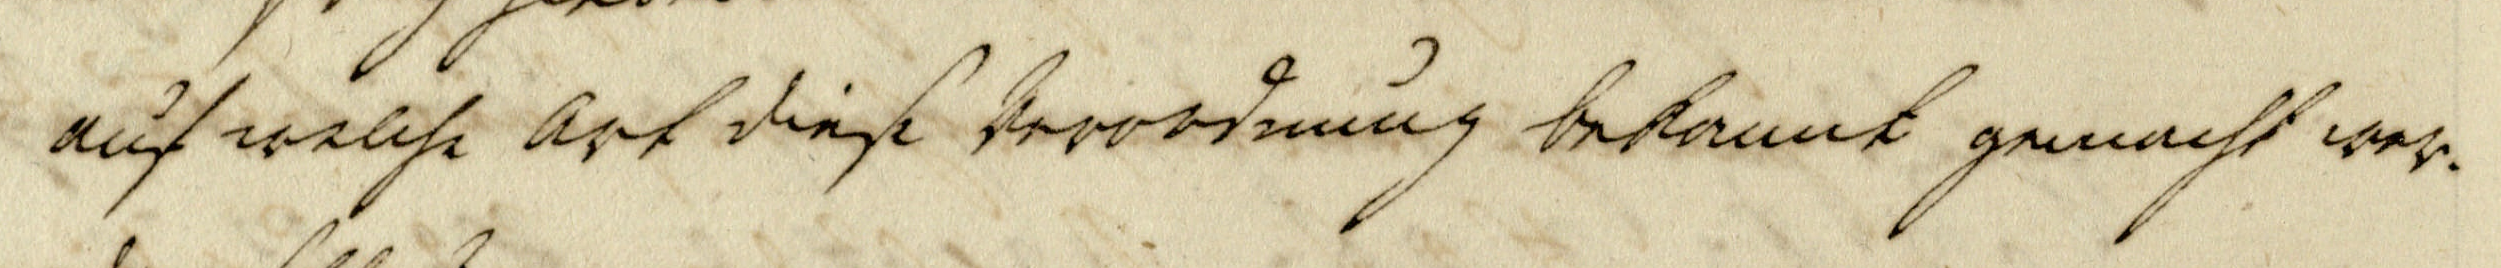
auf welche Art diese Verordnung bekannt gemacht wer¬
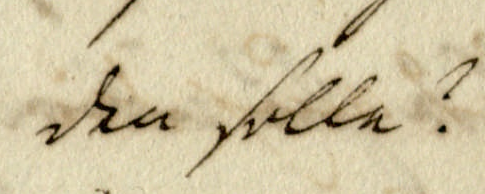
den solle?
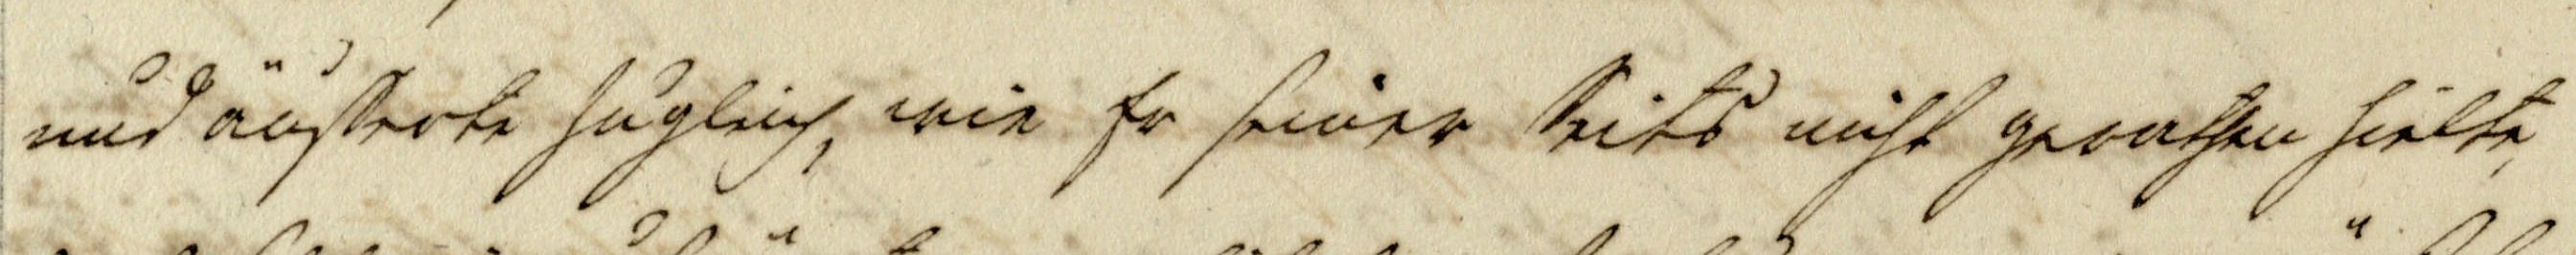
und äusserte zugleich, wie Er seiner Seits nicht gerathen hielte,
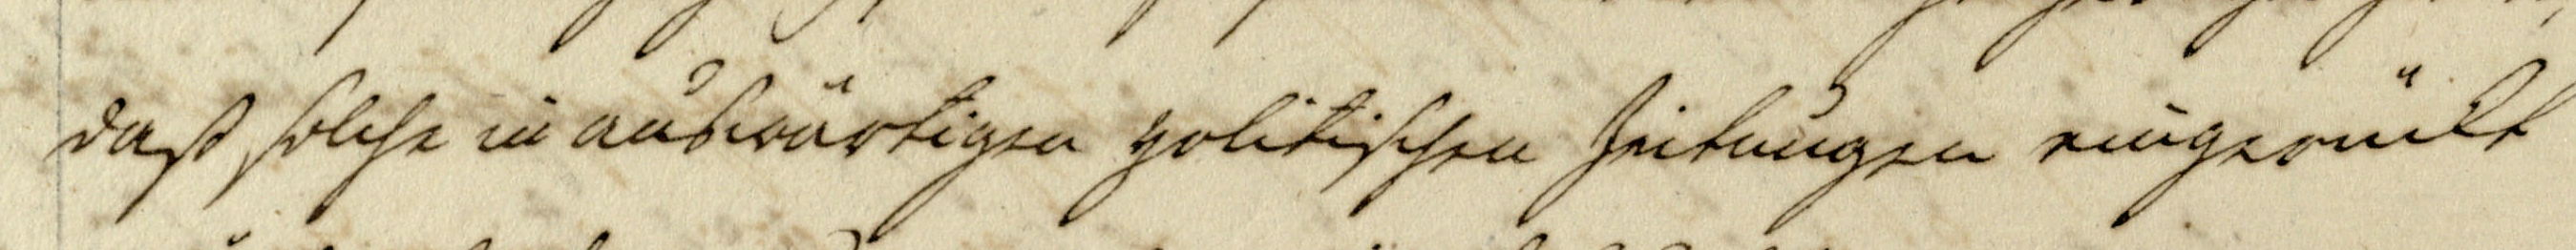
daß solche in auswärtigen politischen Zeitungen eingerückt
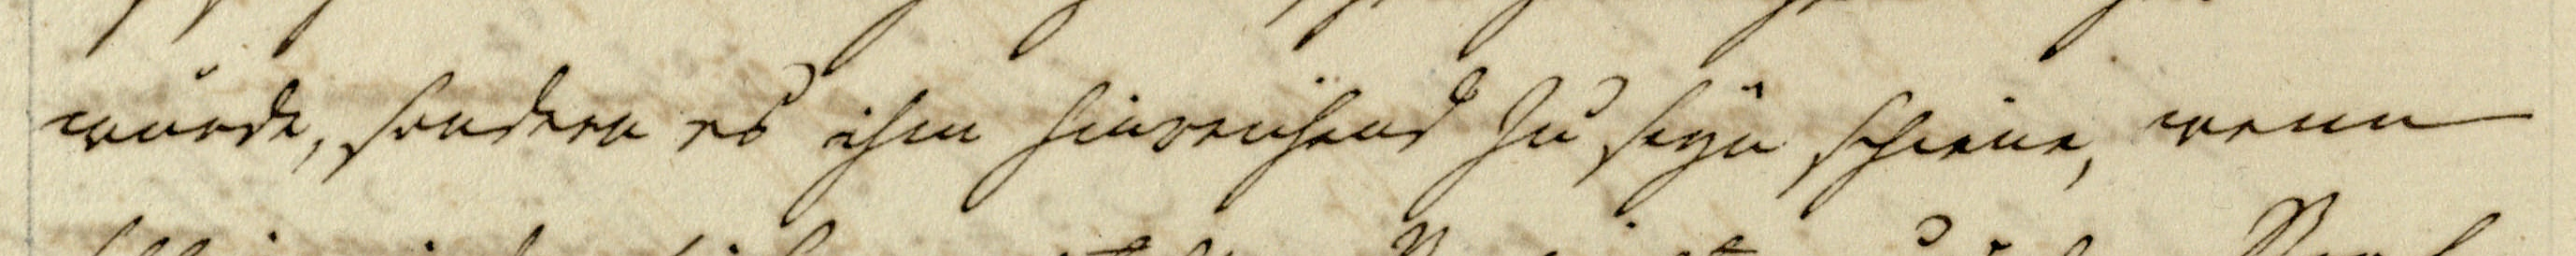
würde, sondern es ihm hinreichend zu seÿn schiene, wenn
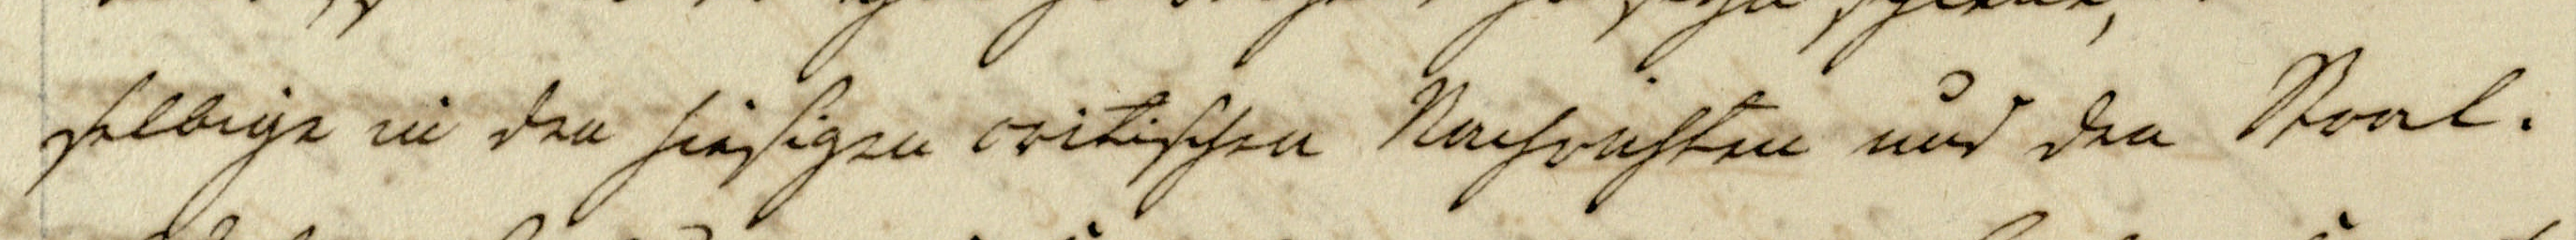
selbige in den hiesigen critischen Nachrichten und den Stral¬
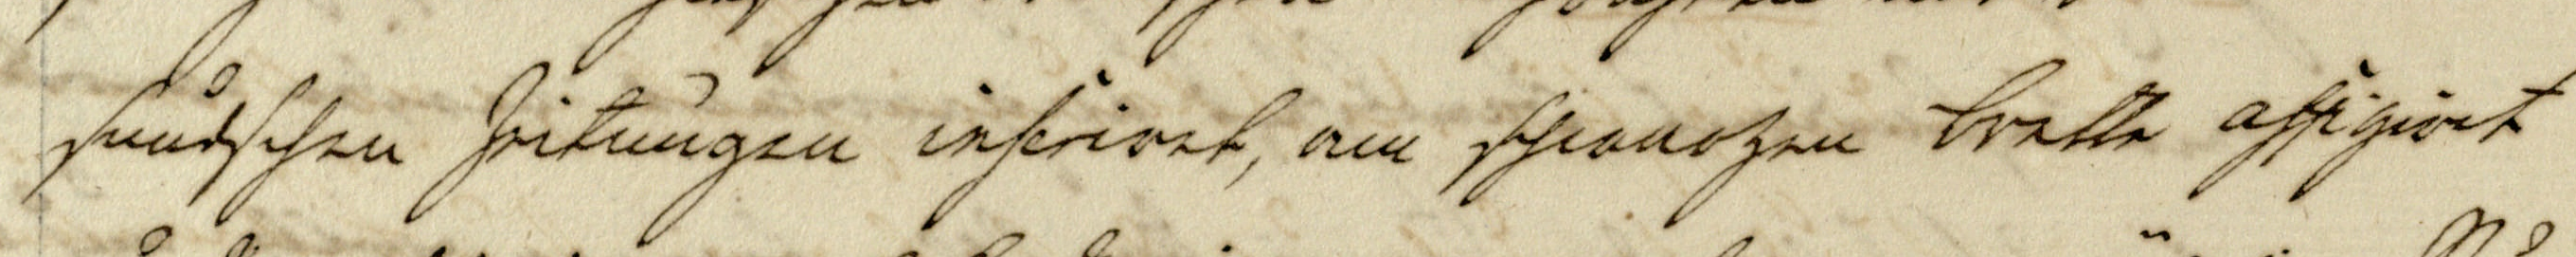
sendschen Zeitungen inseriret, am schwarzen Brette affigiret
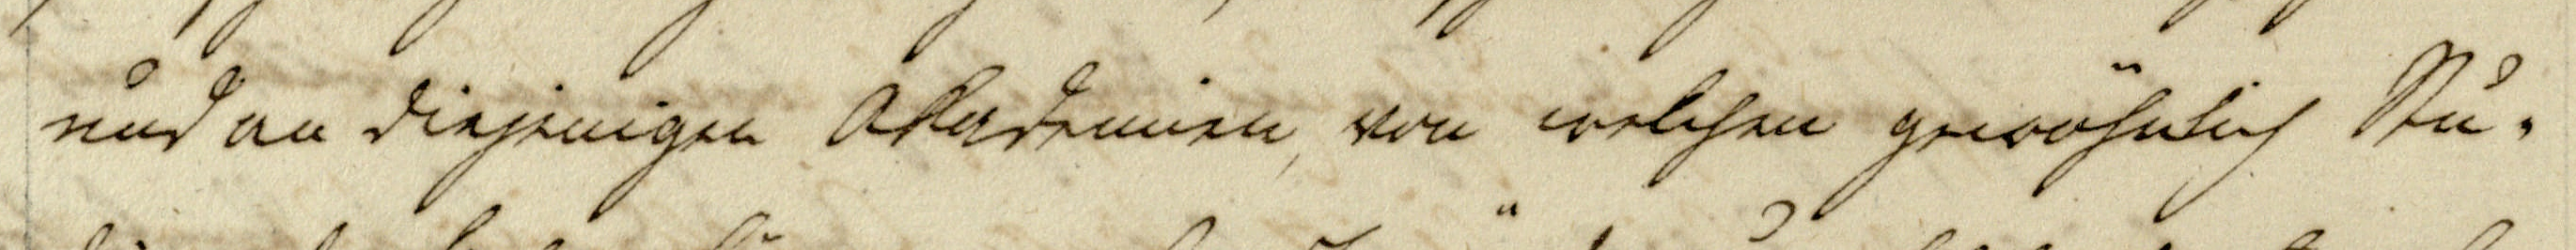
und an diejenigen Akademien von welchen gewöhnlich Stu¬
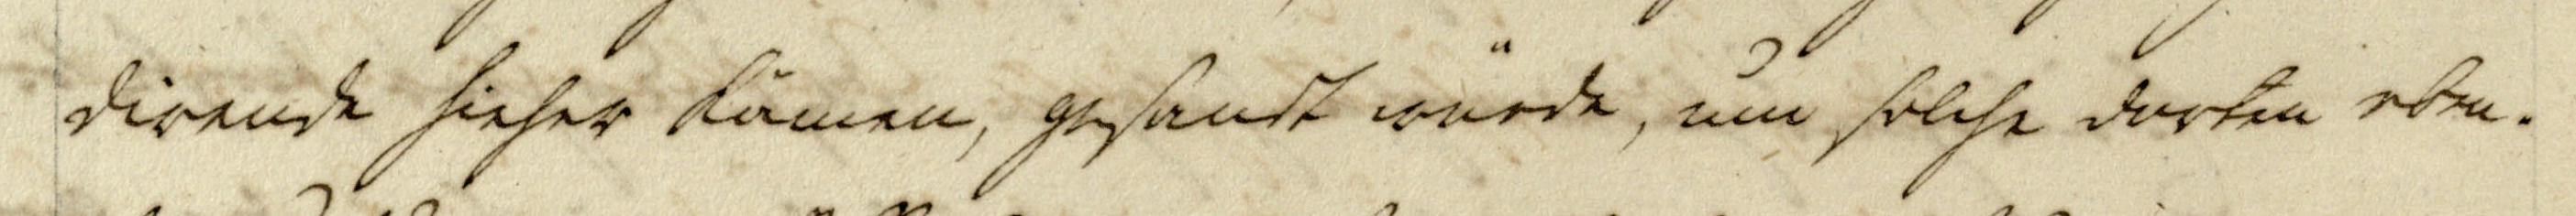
dirende hieher kämen, gesandt würde, um solche dorten eben¬
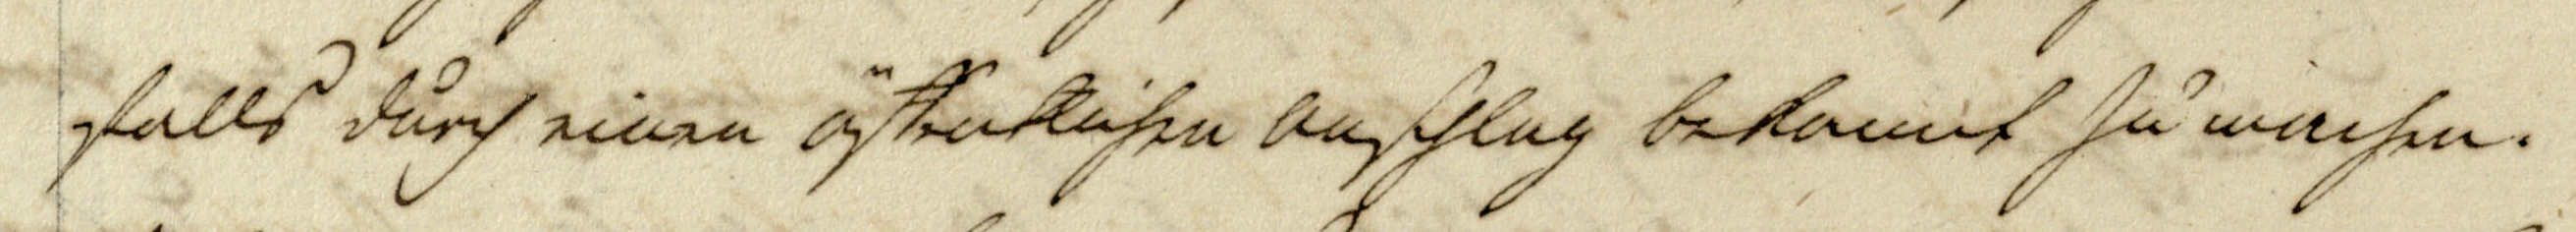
falls durch einen öffentlichen Anschlag bekannt zu machen.
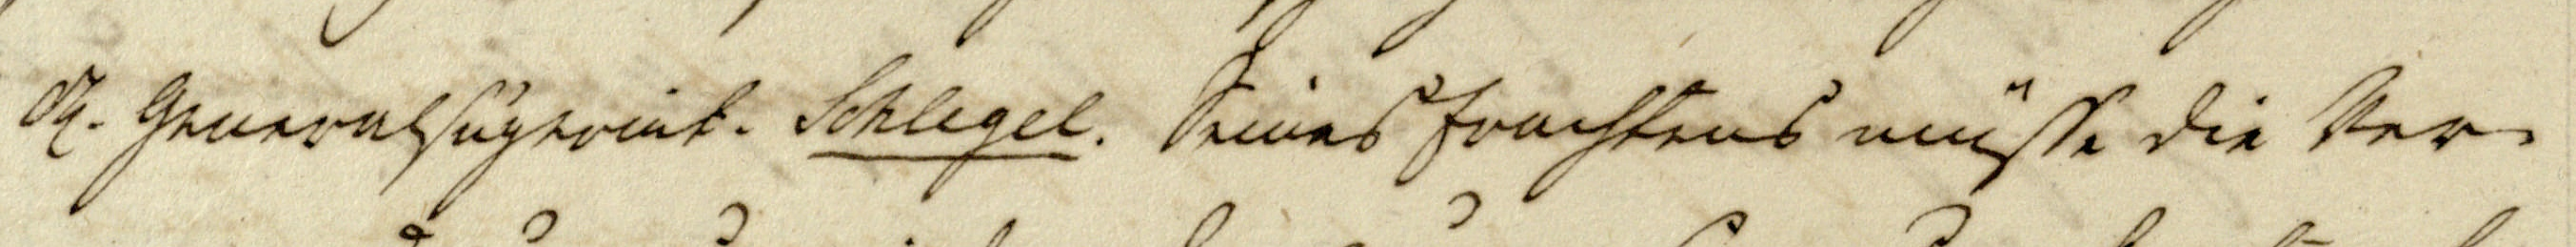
dh. Generatsuperint. Schlegel. Seines Erachtens müsse die Ver¬
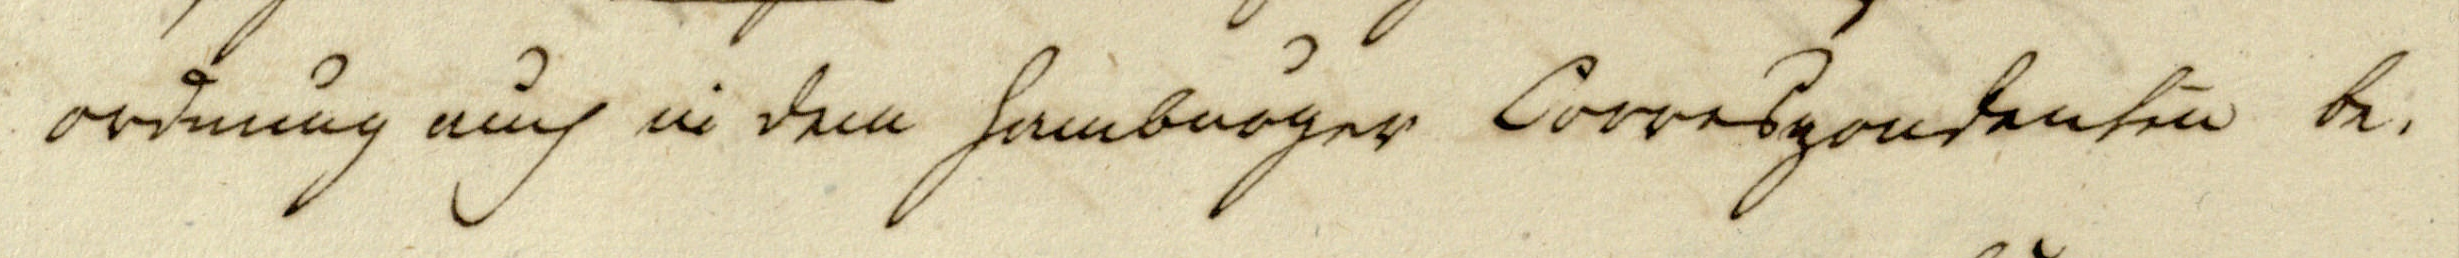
ordnung auch in dem Hamburger Correspondenten be¬
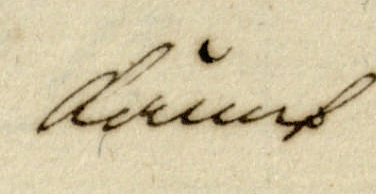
kannt
